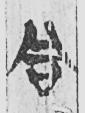同
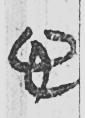心
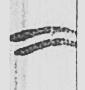二
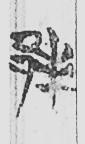邦
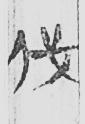伐
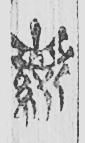{糸若}
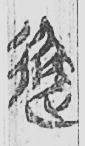{辶𡱵}
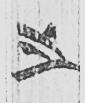之
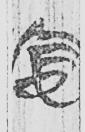{宀𠁩}
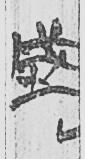城
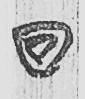回
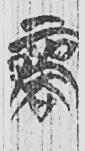商
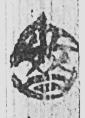{宀必必日}
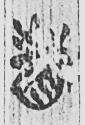{止頁戈}
